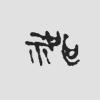神
